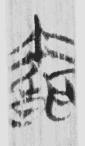{尒䎽}
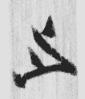之
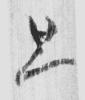也
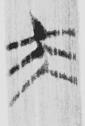夫
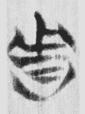周
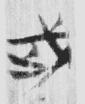武
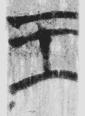王
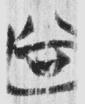甚
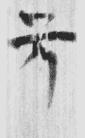元
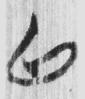㠯（以）
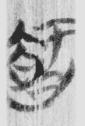智
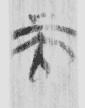而
